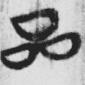厽（叁）
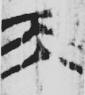天
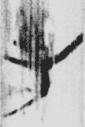子
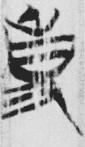事
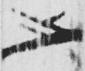之
